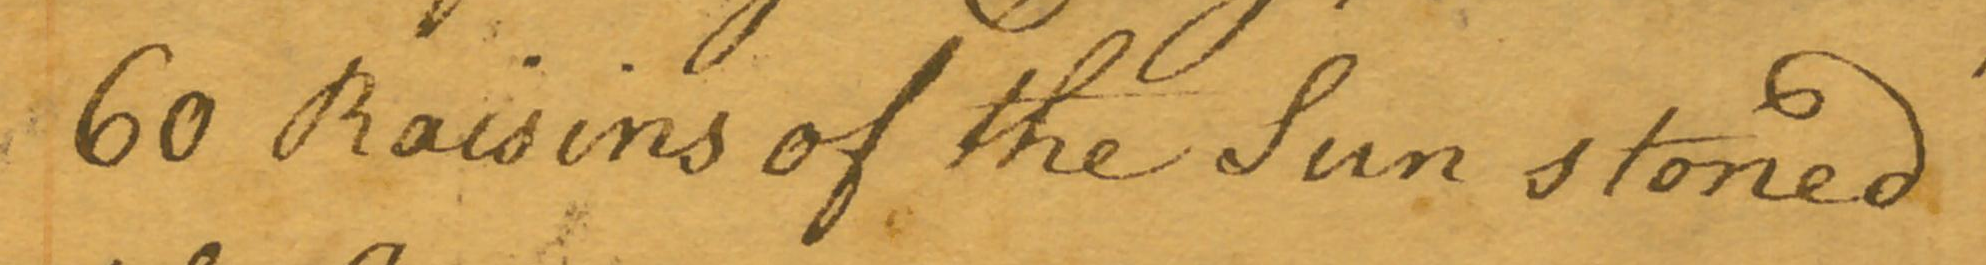60 Raisins of the Sun stoned
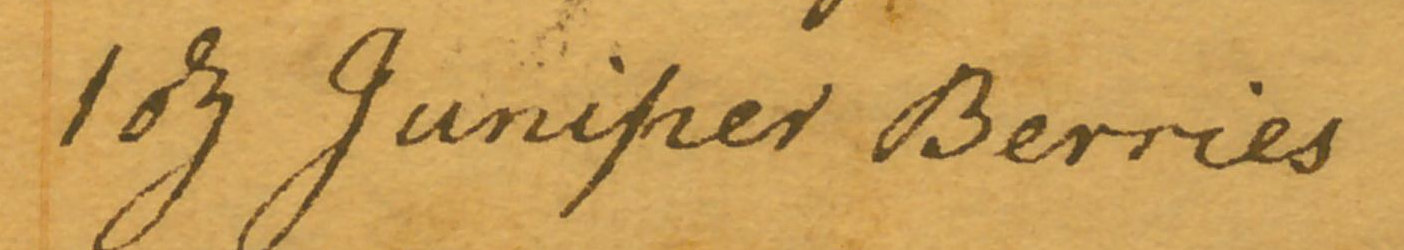1 oz Juniper Berries
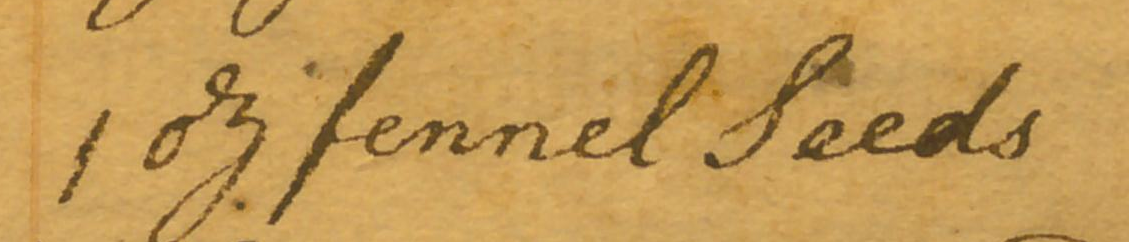1 oz fennel seeds
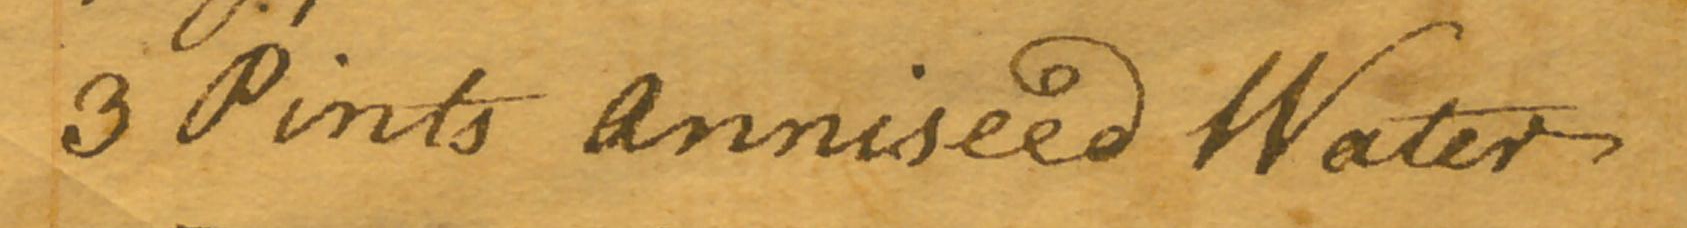3 Pints anniseed Water
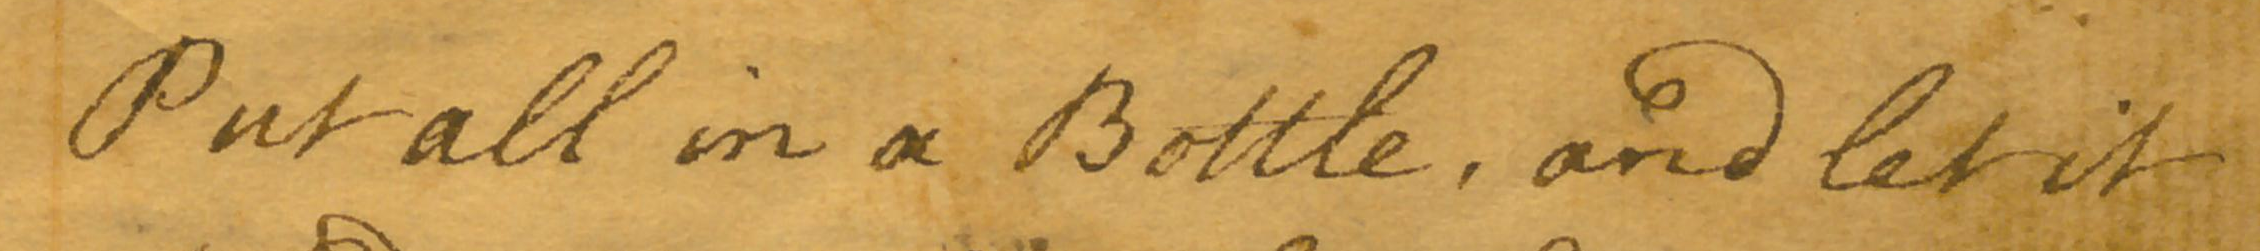Put all in a Bottle, and let it
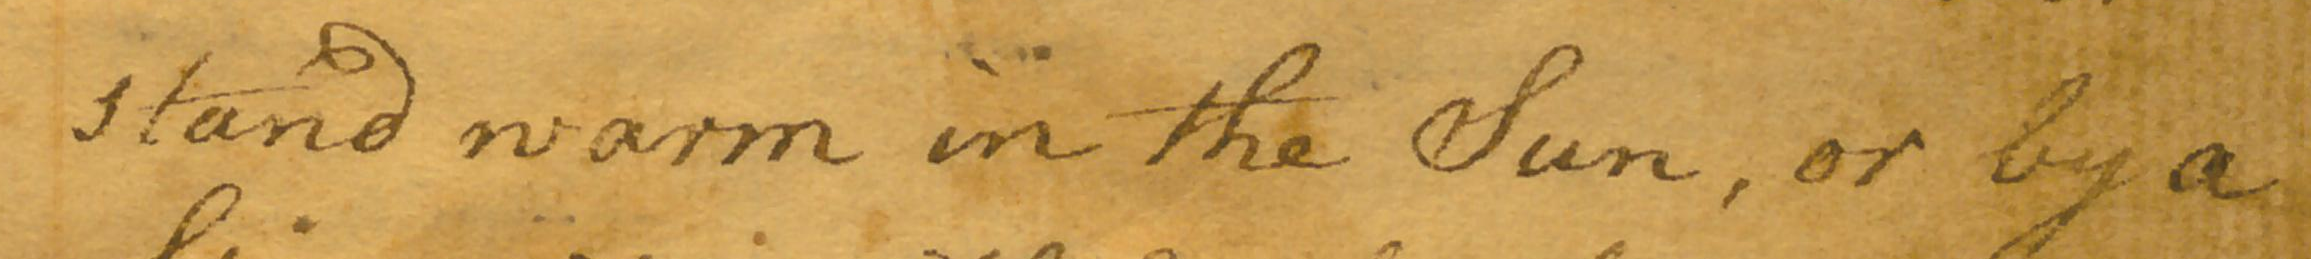stand warm in teh Sun, or by a
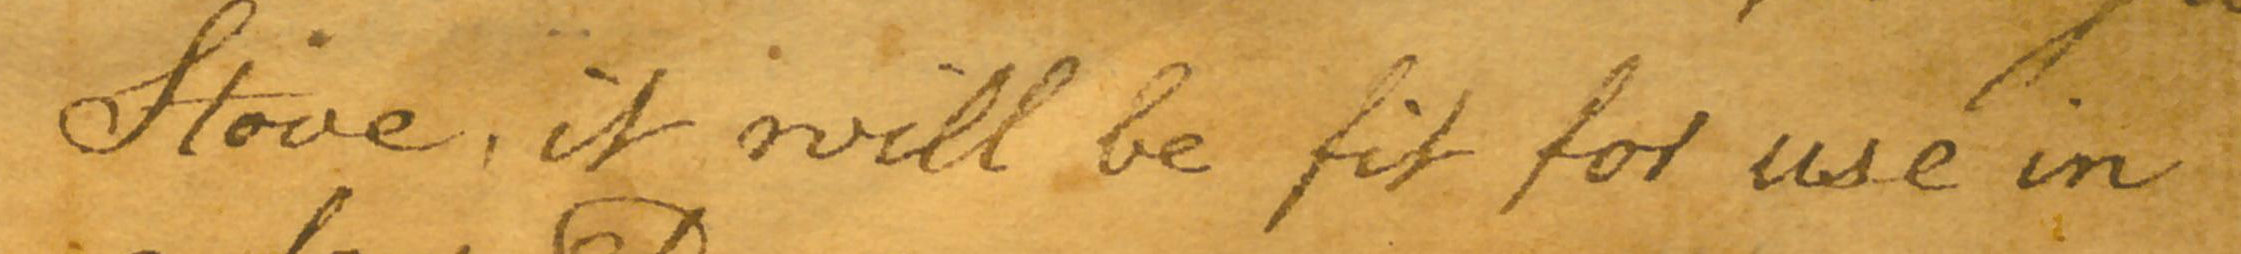Stove, it will be fit for use in
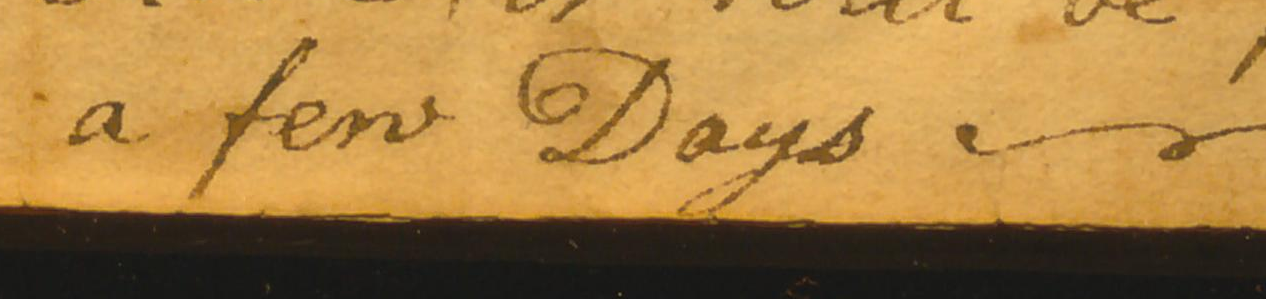a few Days
